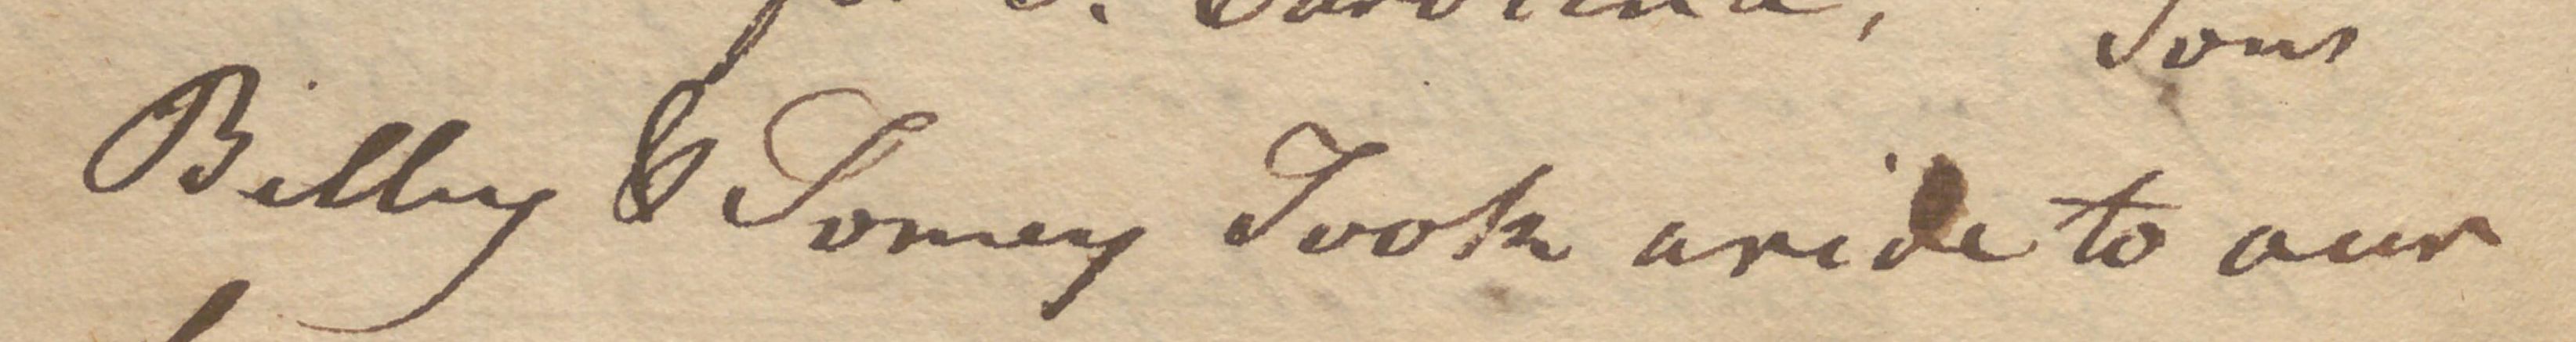Billey & Tomey Took a ride to our
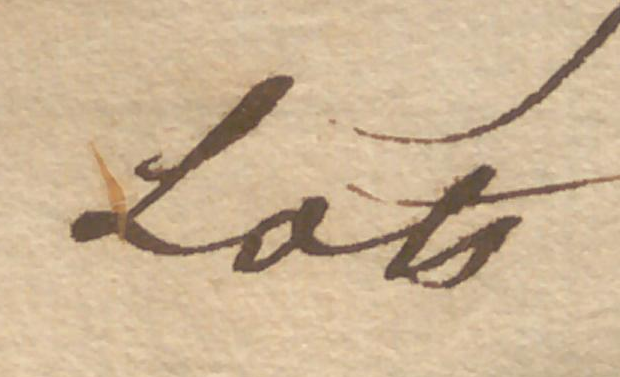Lots
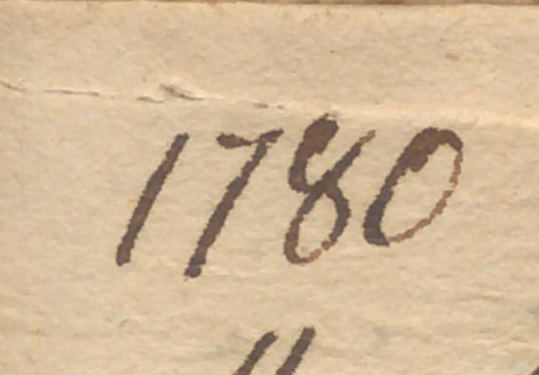1780
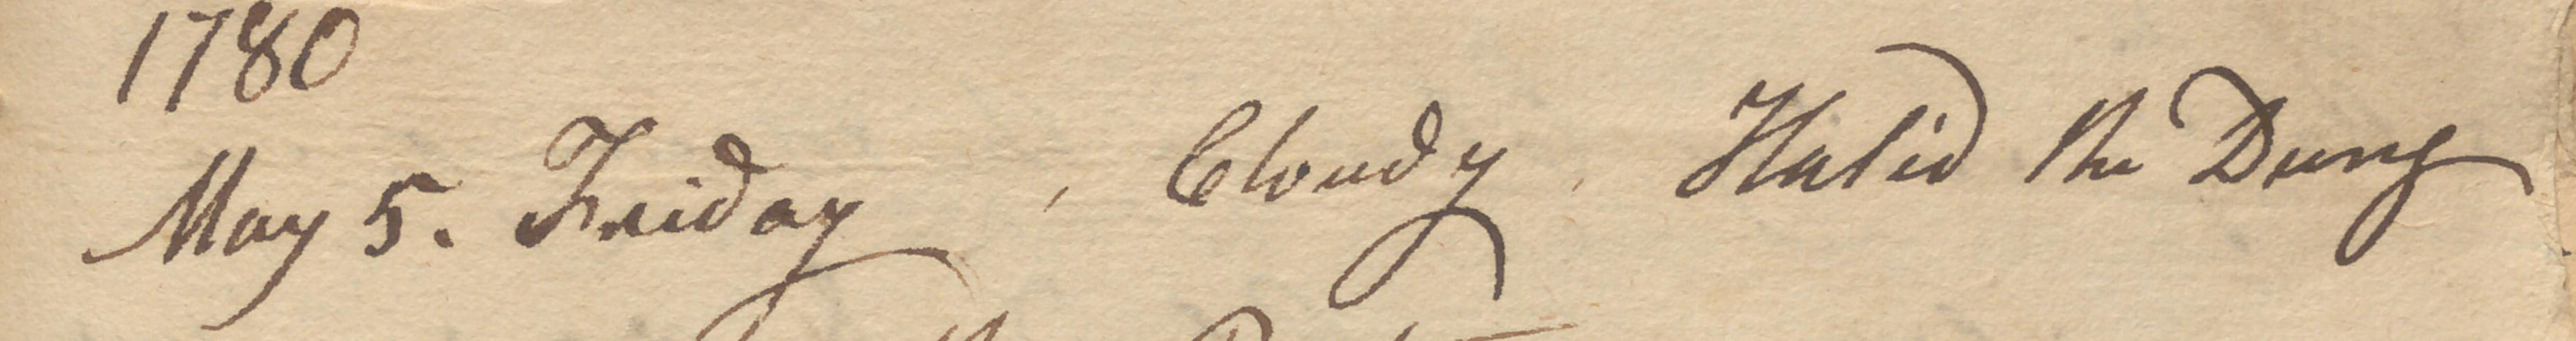May 5^th. Friday, Cloudy Hale'd the Dung
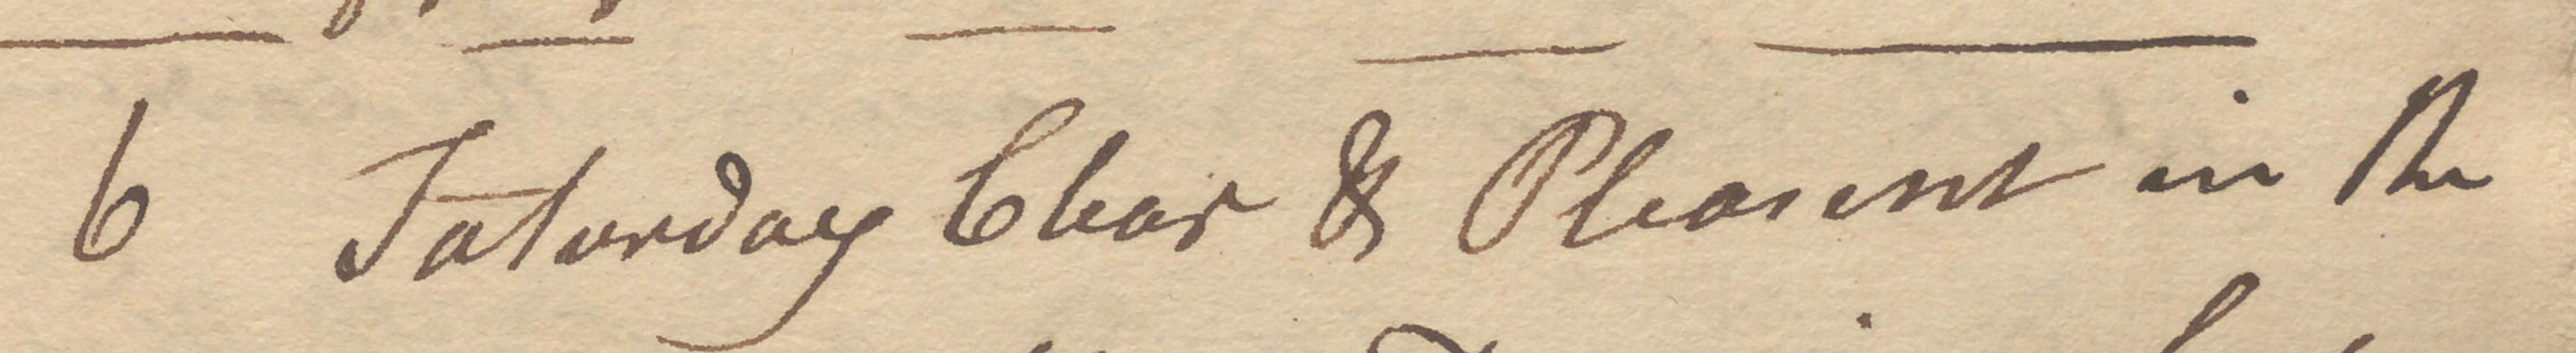6 Saturday Clear & Pleasent in the
